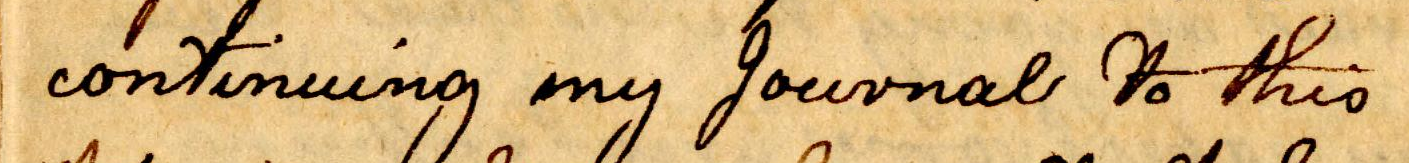continuing my Journal to this
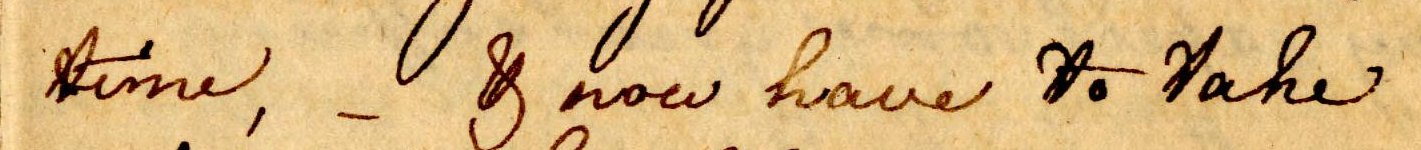time, - & now have to take
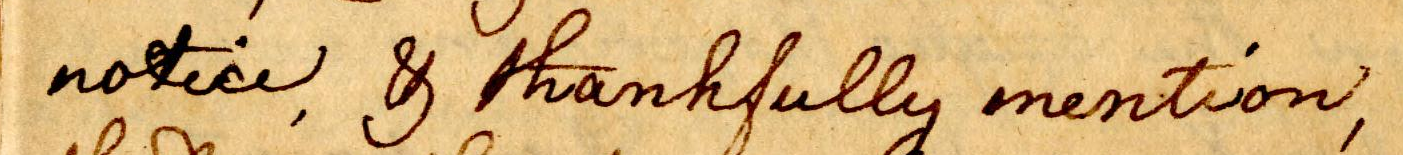notice, & thankfully mention,
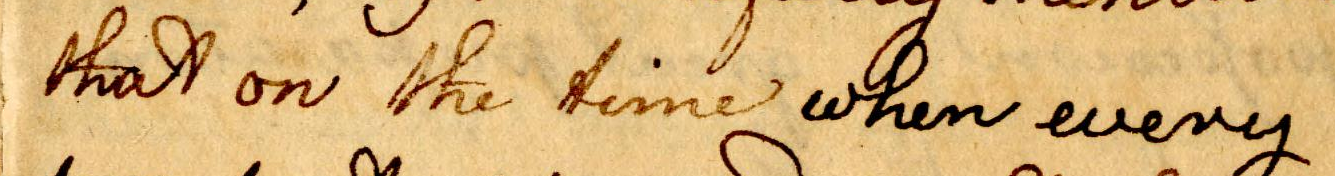that on the time when every
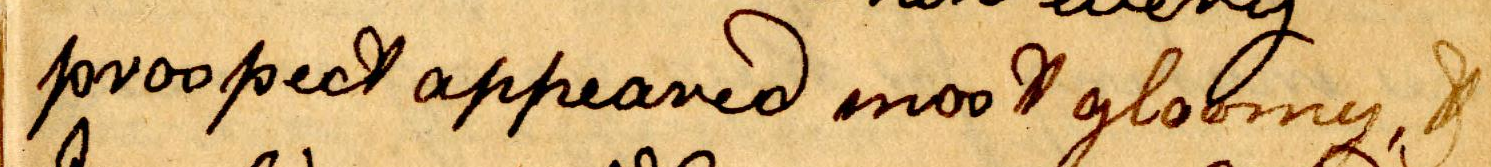prospect appeared most gloomy, &
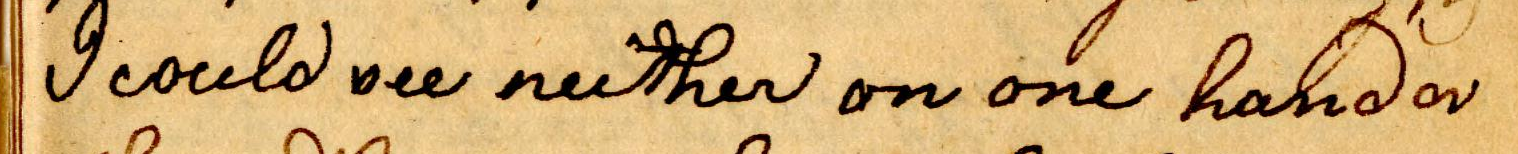I could see neither on one hand or
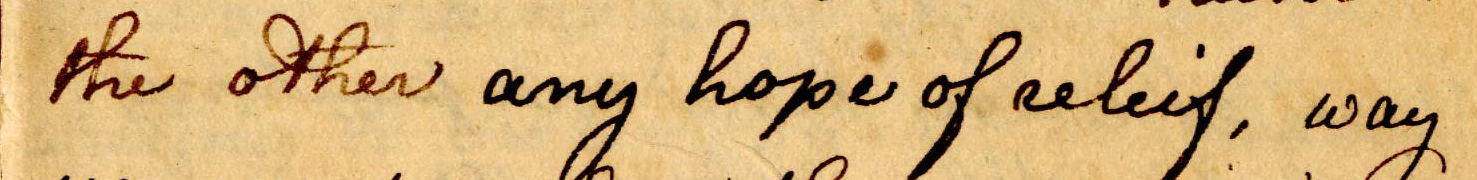the other any hope of releif, way
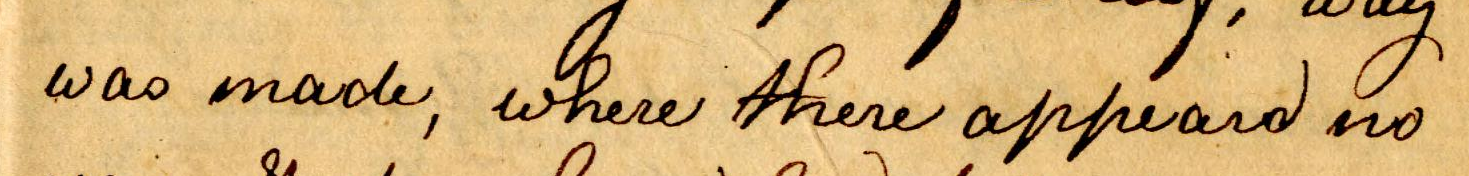was made, where there appeard no
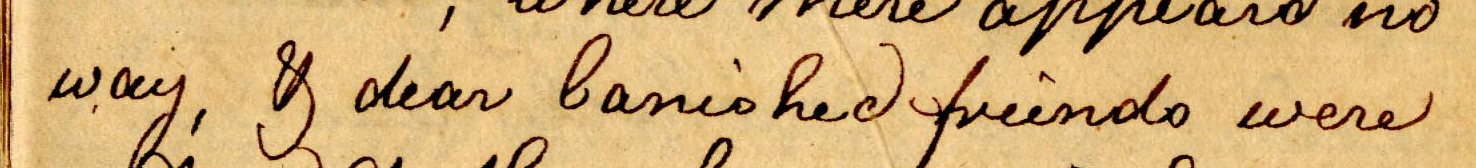way, & dear banished friends were
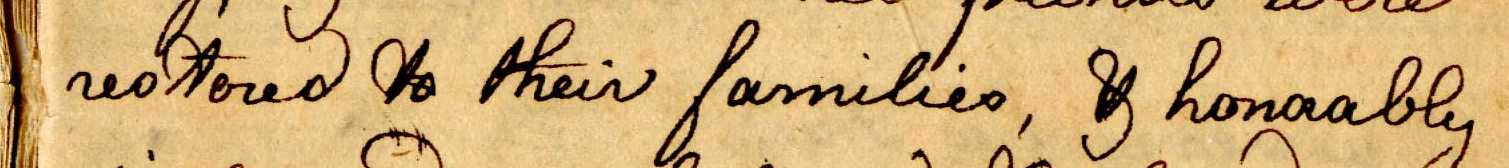restored to their families, & honorably
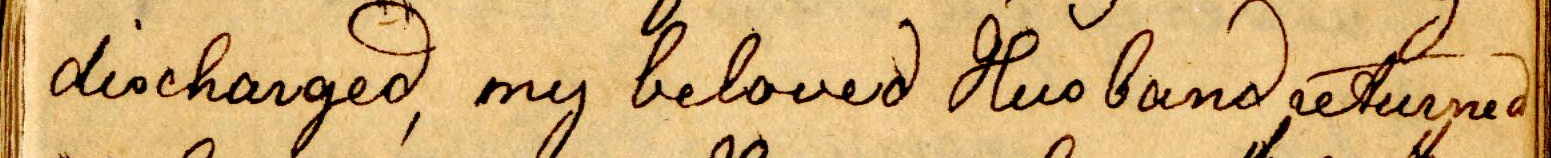discharged, my beloved Husband returned
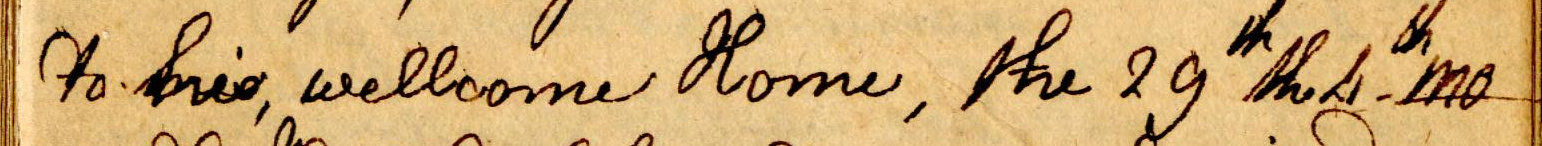to his wellcome Home, the 29^th the 4^th MO
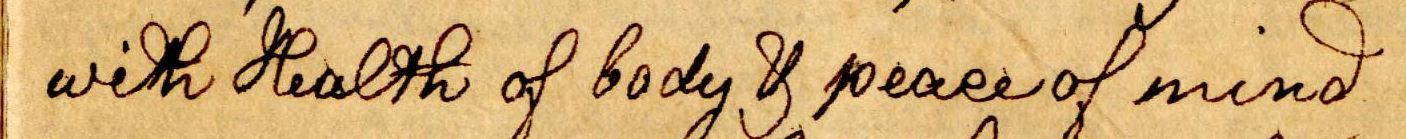with Health of body & peace of mind
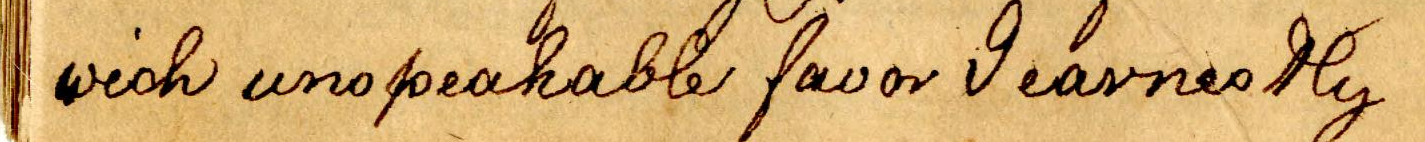wich unspeakable favor I earnestly
